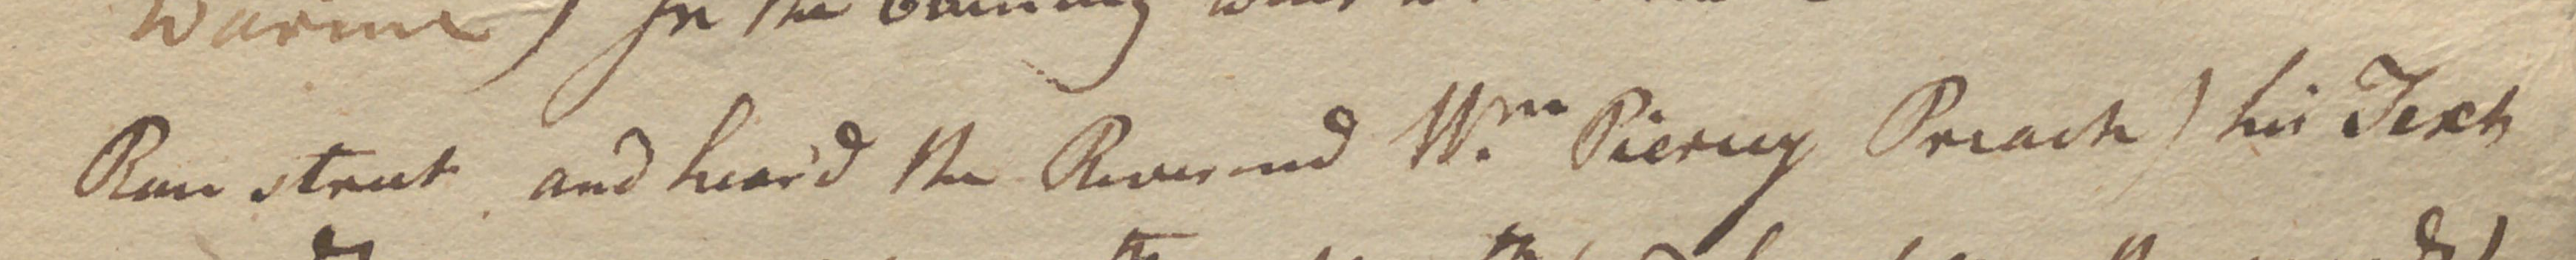Race street, and heard the Reverend W^m. Piercey Preach his Text
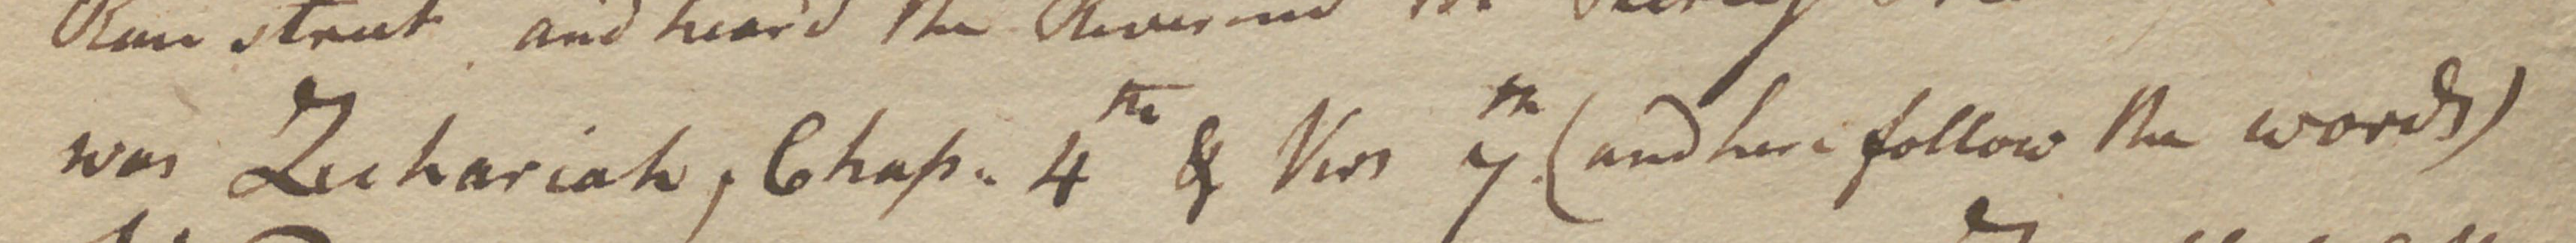was Zechariah, Chap. 4^th & Vers 7^th (and here follow the words)
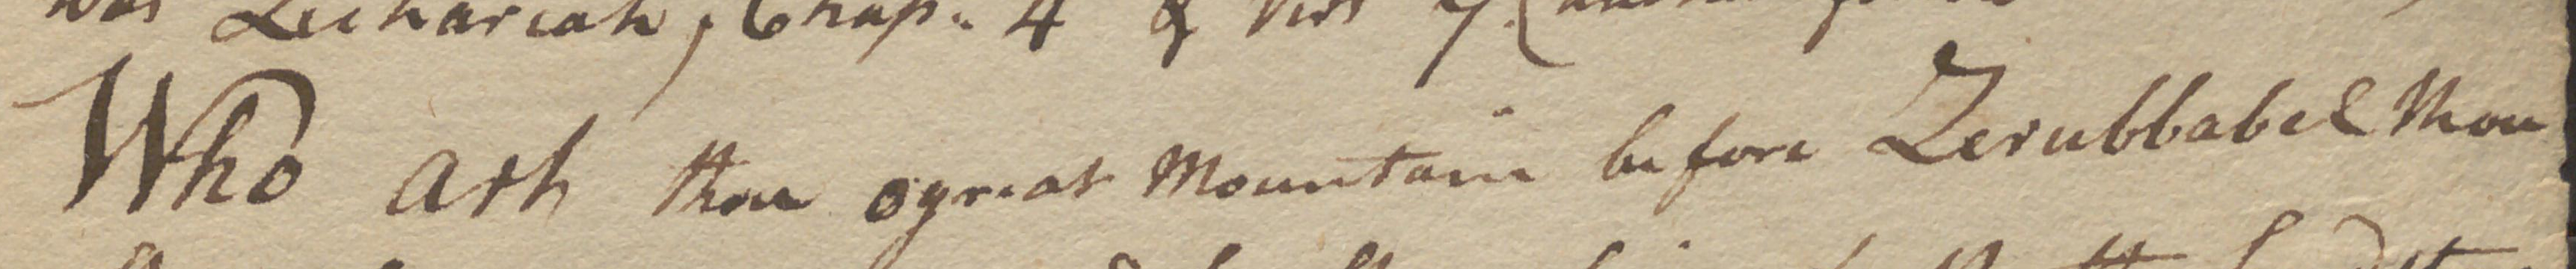Who ask thee o great mountain before Zerubbabel thou
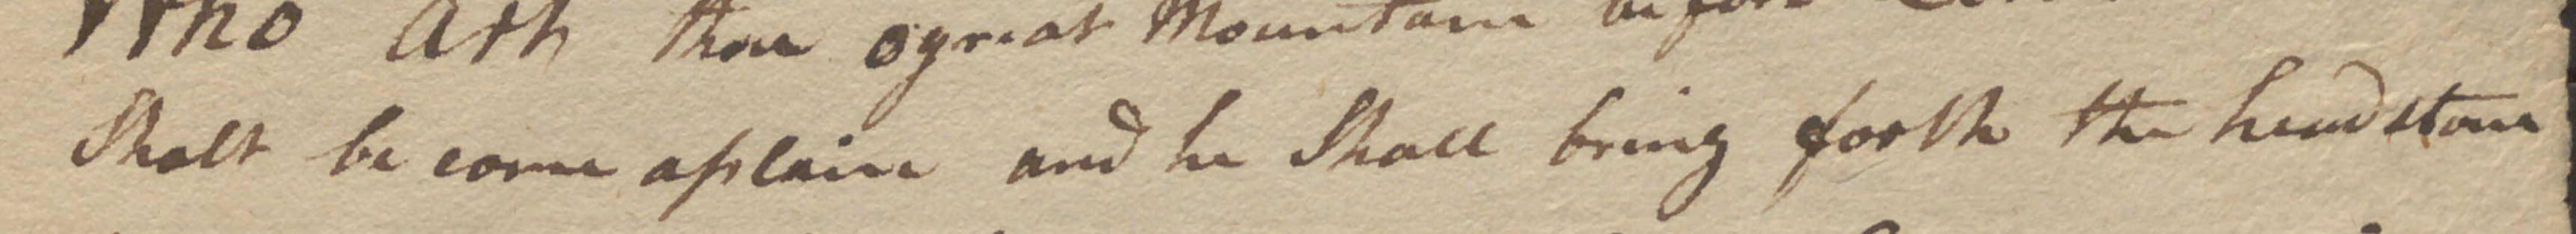shalt be come aplain and he shall bring forth the headstone
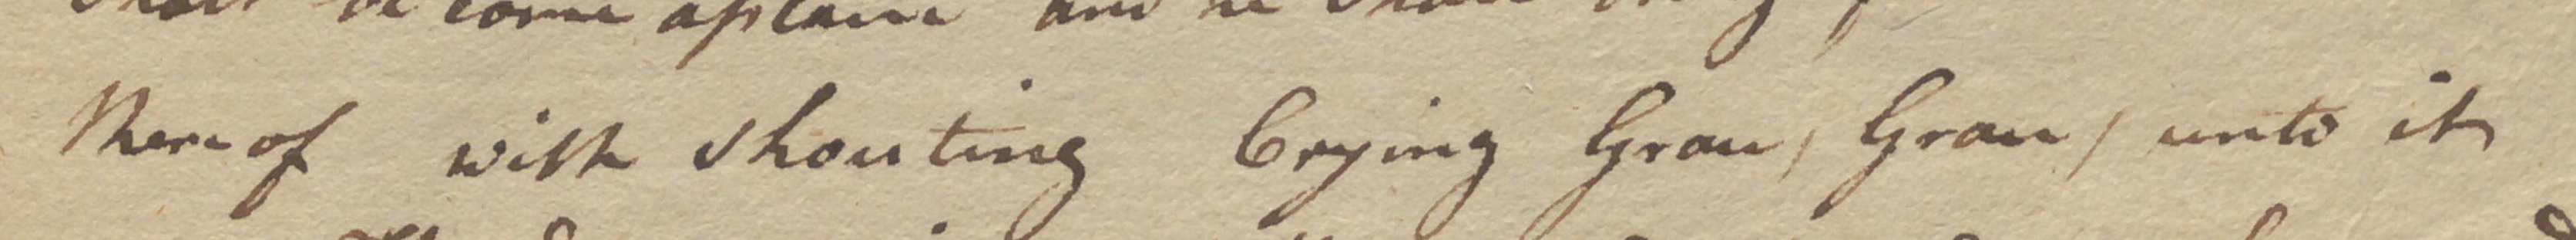thereof with shouting Crying Grau, Grau, unto it
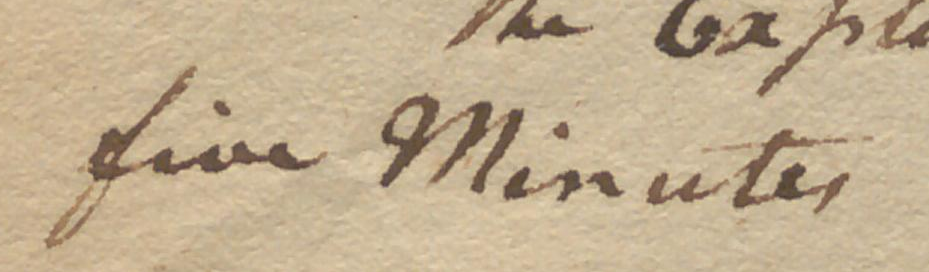five Minutes
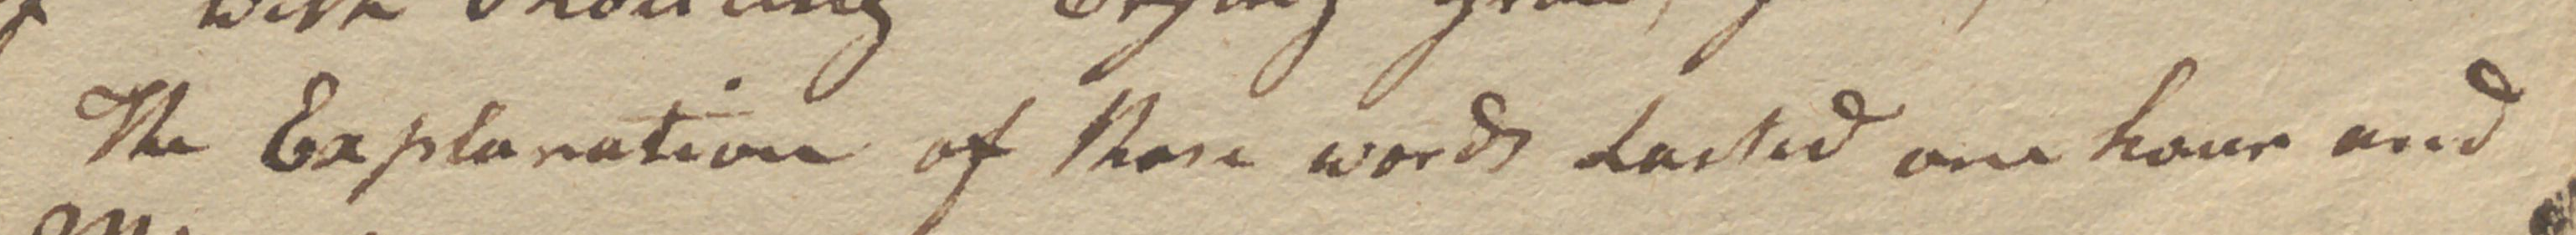The Explanation of those words Lasted one hour and
